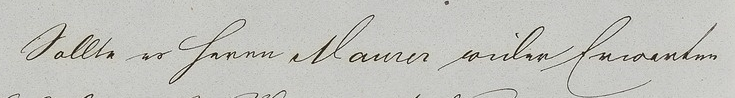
Sollte es Herrn Maurer wider Erwarten
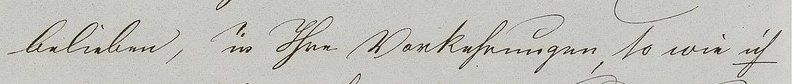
belieben, in Ihre Vorkehrungen, so wie ich
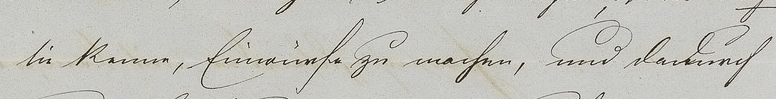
sie kenne, Einwürfe zu machen, und dadurch
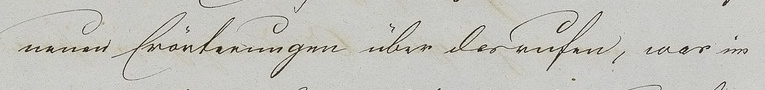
neuen Erörterungen über das rufen, was im
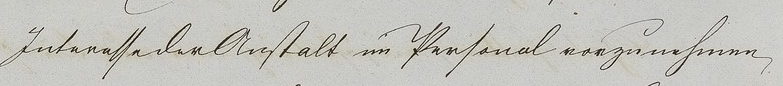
Interesse der Anstalt im Personal vorzunehmen
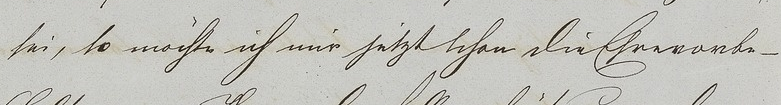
sei, so möchte ich mir jetzt schon die Ehre vorbe-
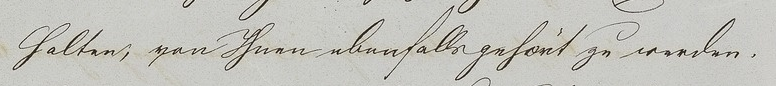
halten, von Ihnen ebenfalls gehört zu werden.
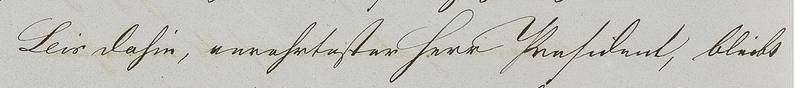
Bis dahin, verehrtester Herr President, bleibt
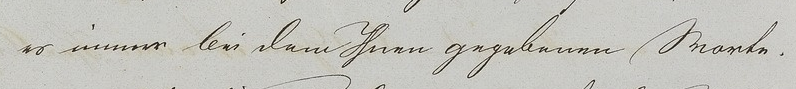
es immer bei dem Ihnen gegebenen Worte.
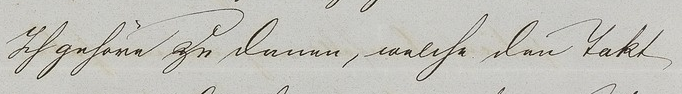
Ich gehöre zu denen, welche den Takt
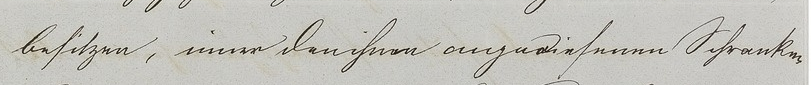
besitzen, inner den ihnen angewiesenen Schranken
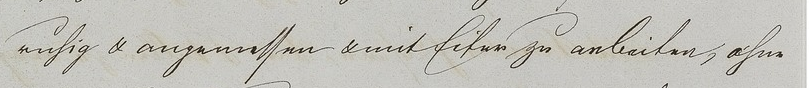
ruhig & angemessen & mit Eifer zu arbeiten, ohne
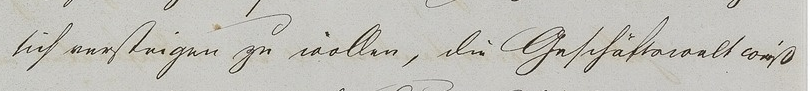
sich versteigen zu wollen, die Geschäftswelt weiß
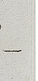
diese
